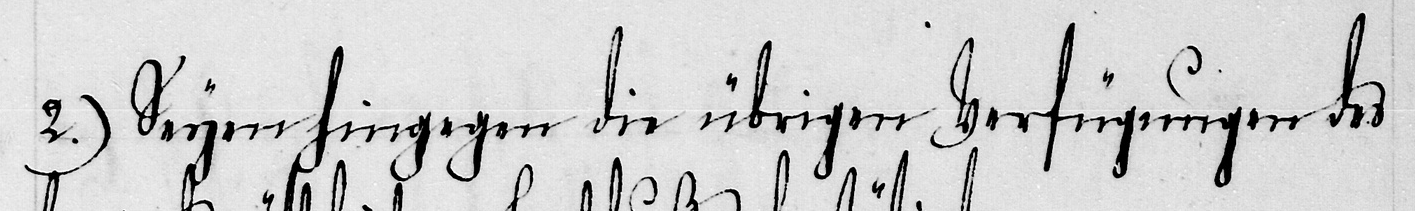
2.) Seyen hingegen die übrigen Verfügungen des
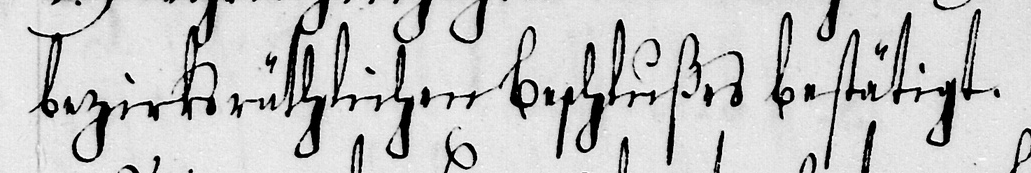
bezirksräthlichen Beschlußes bestätigt.
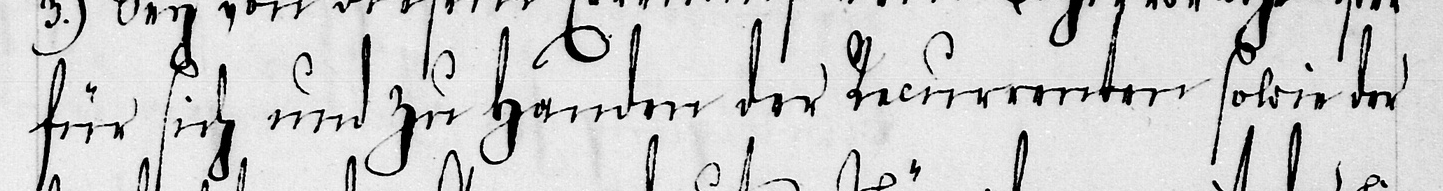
für sich und zu Handen der Recurrenten sowie der
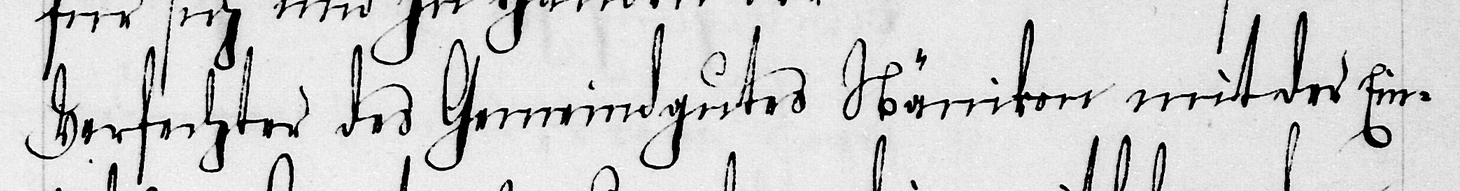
Verfechter des Gemeindgutes Nänikon mit der Ein¬
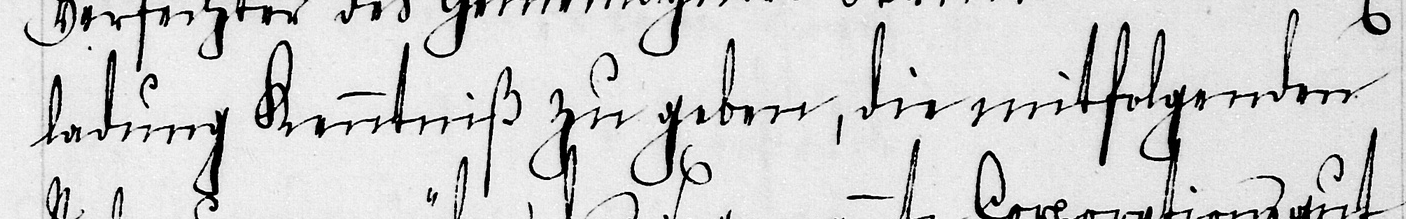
ladung Kenntniß zu geben, die mitfolgenden
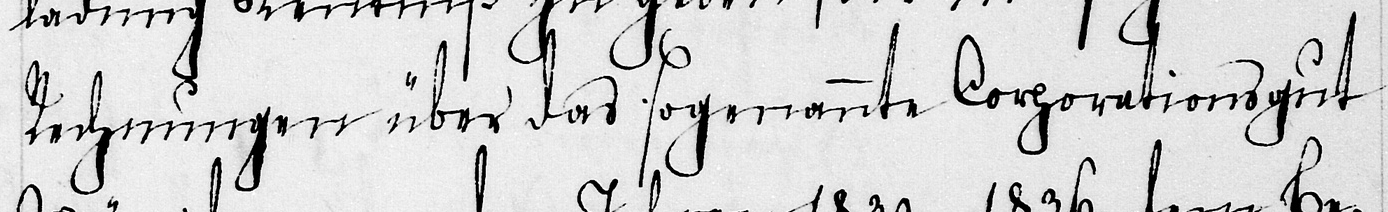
Rechnungen über das sogenannte Corporationsgut
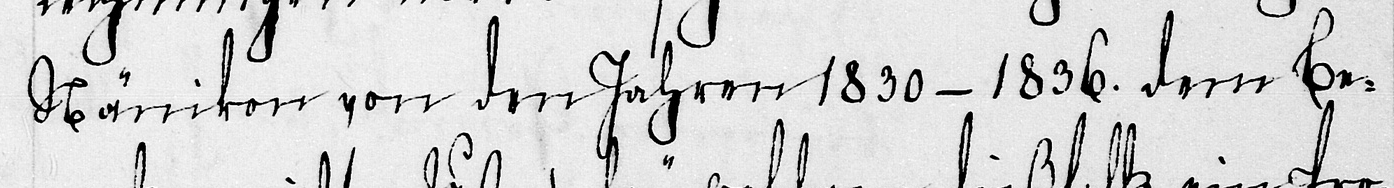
Nänikon von den Jahren 1830–1836. dem Be¬
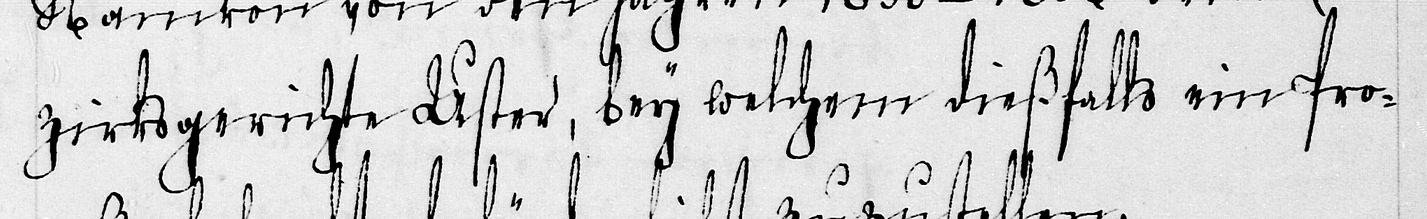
zirksgericht Uster, bey welchem dießfalls ein Pro¬
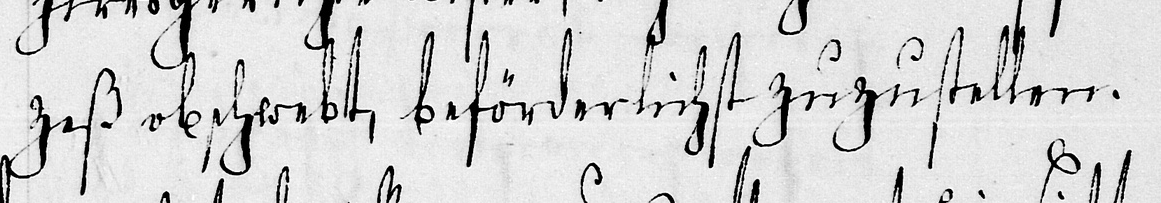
zeß obschwebt, beförderlichst zuzustellen.
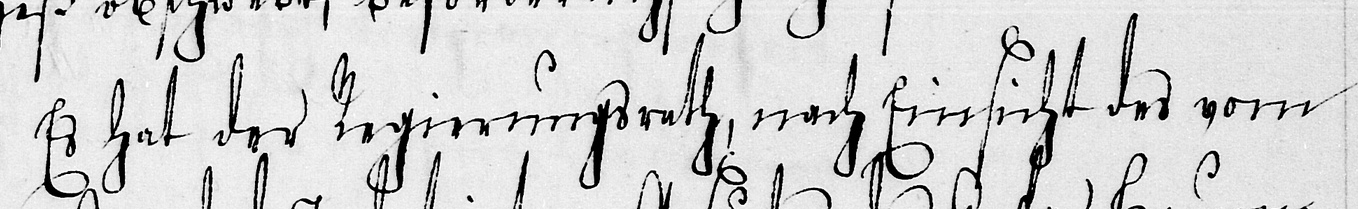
Es hat der Regierungsrath, nach Einsicht des vom
